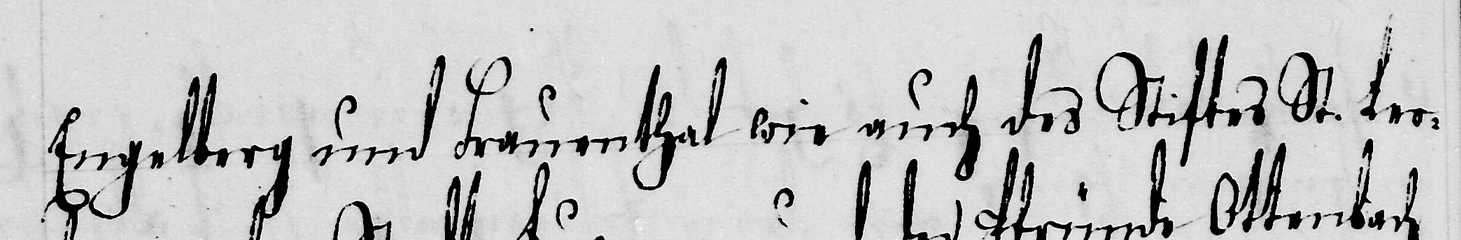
Engelberg und Frauenthal wie auch des Stiftes St. Leo¬
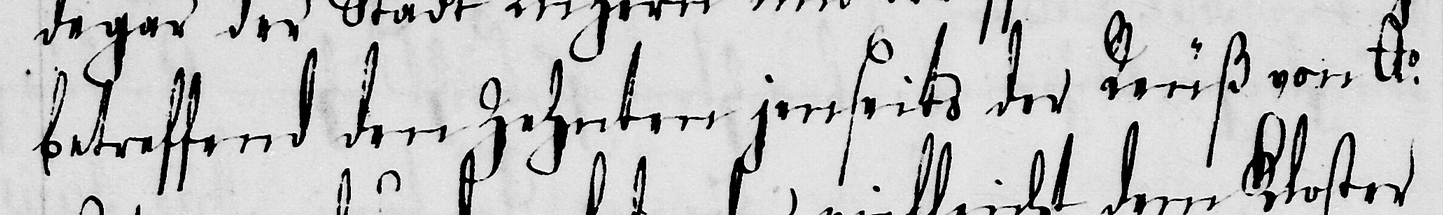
betreffend den Zehnten jenseits der Reuß von Ao.
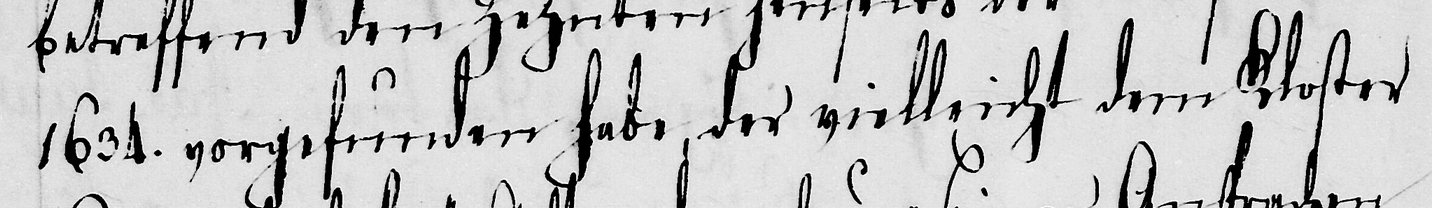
1634. vorgefunden habe, der vielleicht dem Kloster
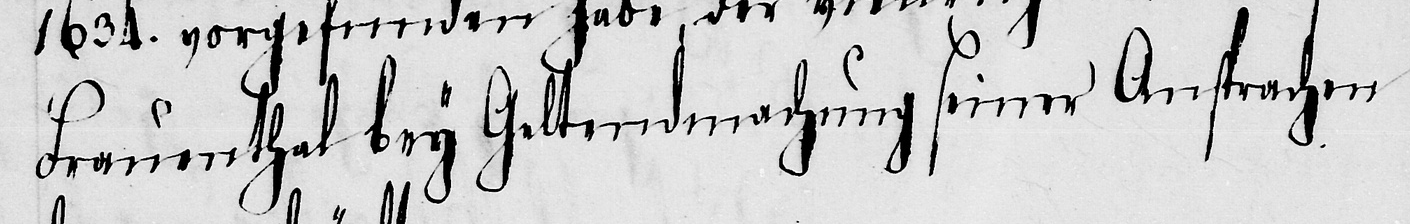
Frauenthal bey Geltendmachung seiner Ansprachen
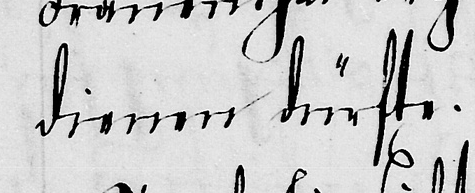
dienen dürfte.
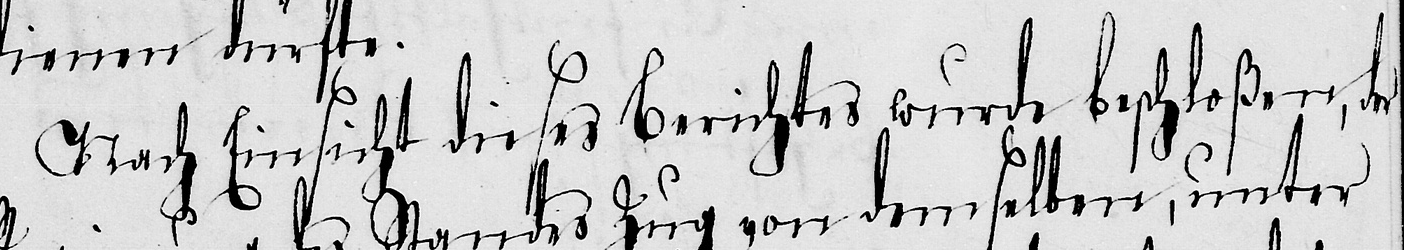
Nach Einsicht dieses Berichtes wurde beschloßen,
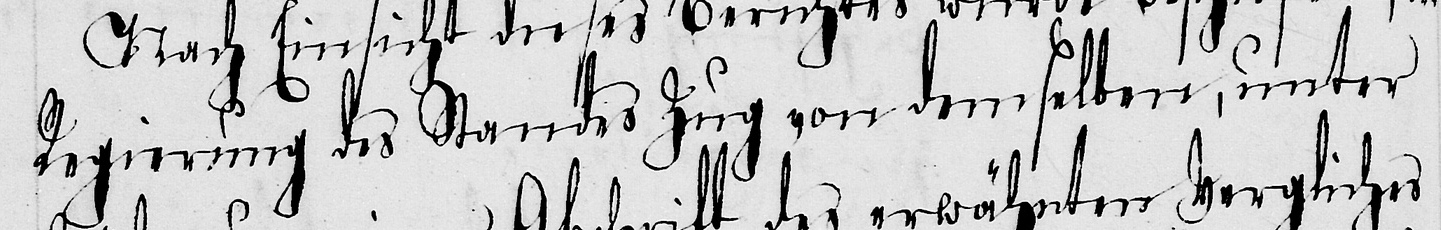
Regierung des Standes Zug von demselben, unter
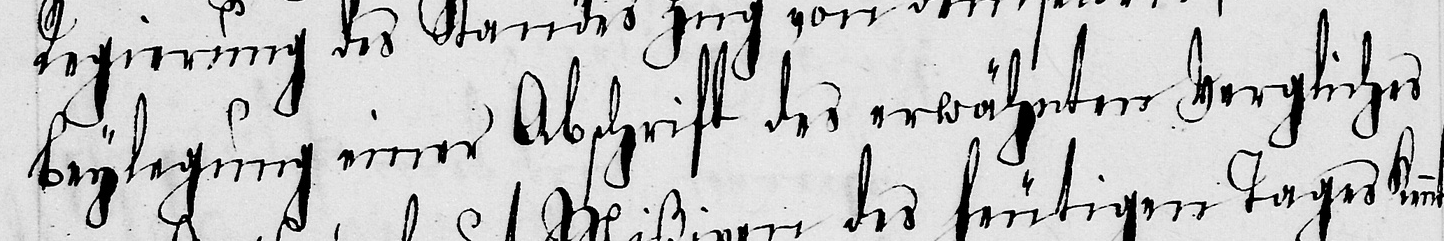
Beylegung einer Abschrift des erwähnten Vergliches
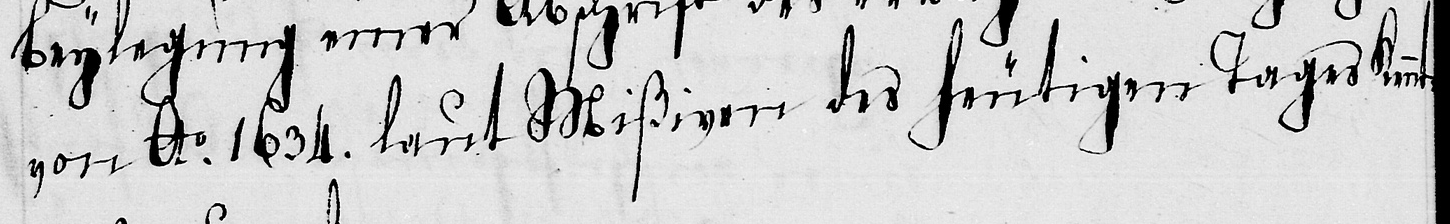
von Ao. 1634. laut Mißiven des heutigen Tages Ken¬
